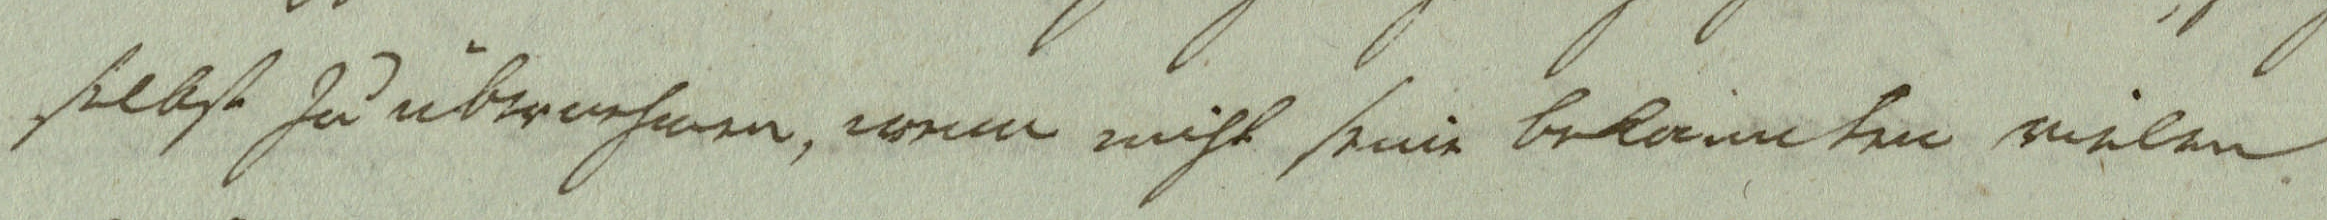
selbst zu übernehmen, wenn nicht seine bekannten vielen
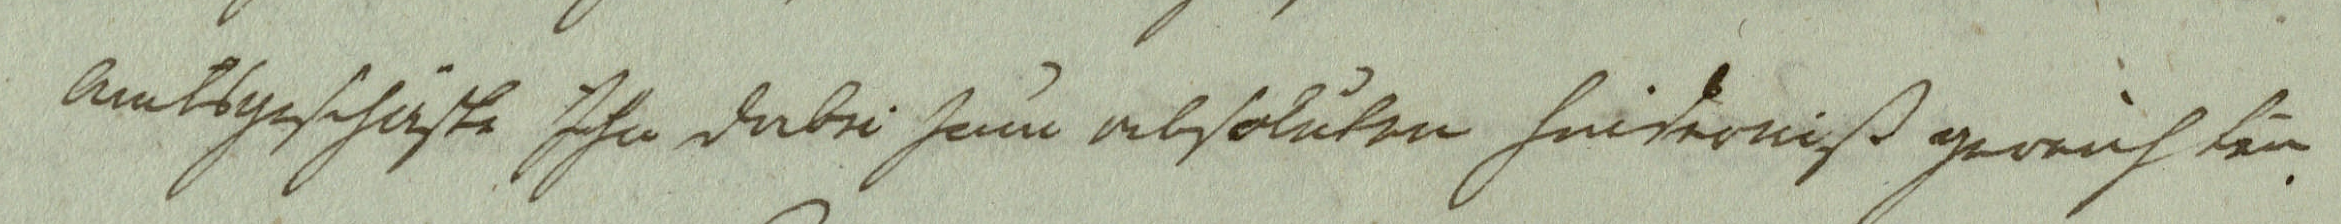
Amtsgeschäfte Ihm dabei zum absoluten Hinderniß gereichten.
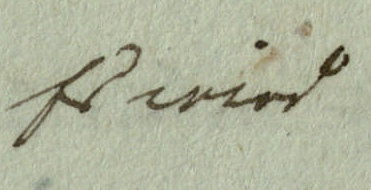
Es wird
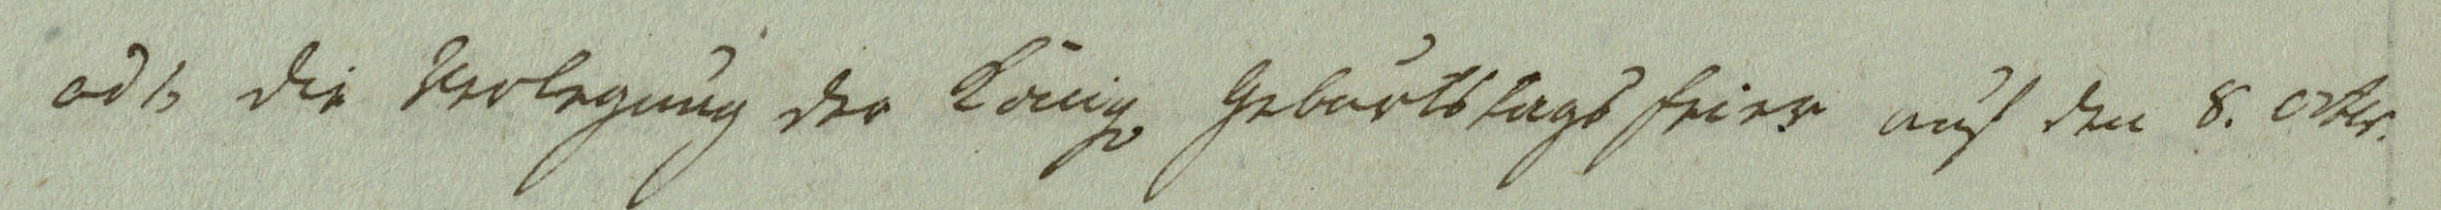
ad 1, die Verlegung der Königl. Geburtstagsfeier auf den 8. octbr.
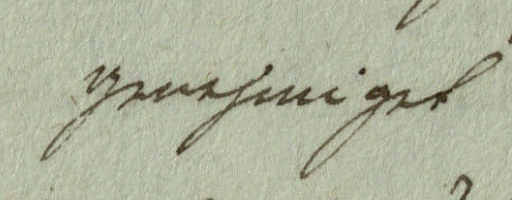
genehmiget.
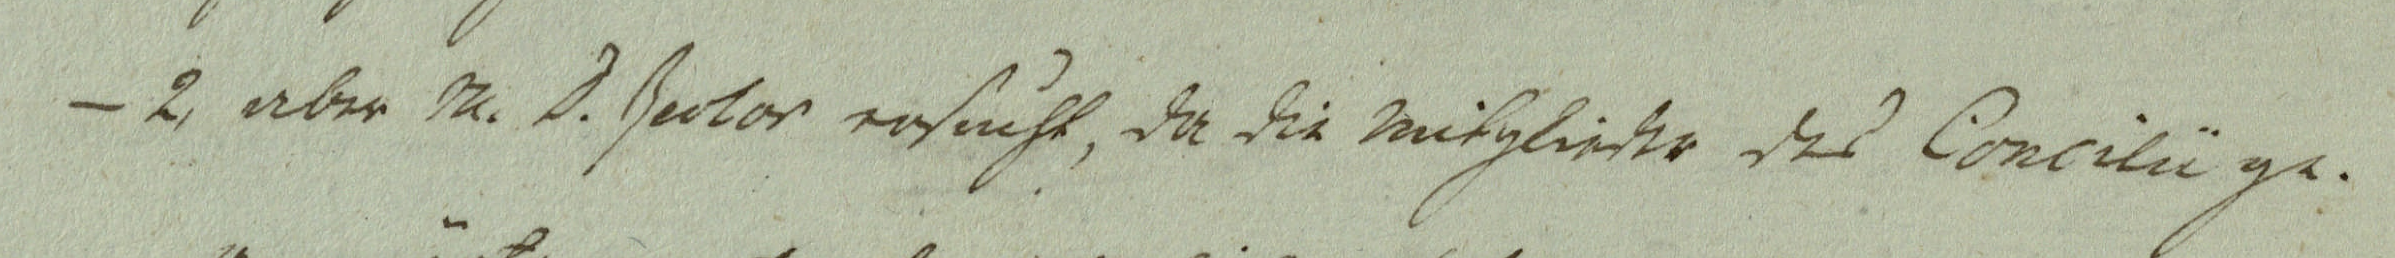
2, aber M. D. Rector ersucht, da die Mitglieder des Concilii ge¬
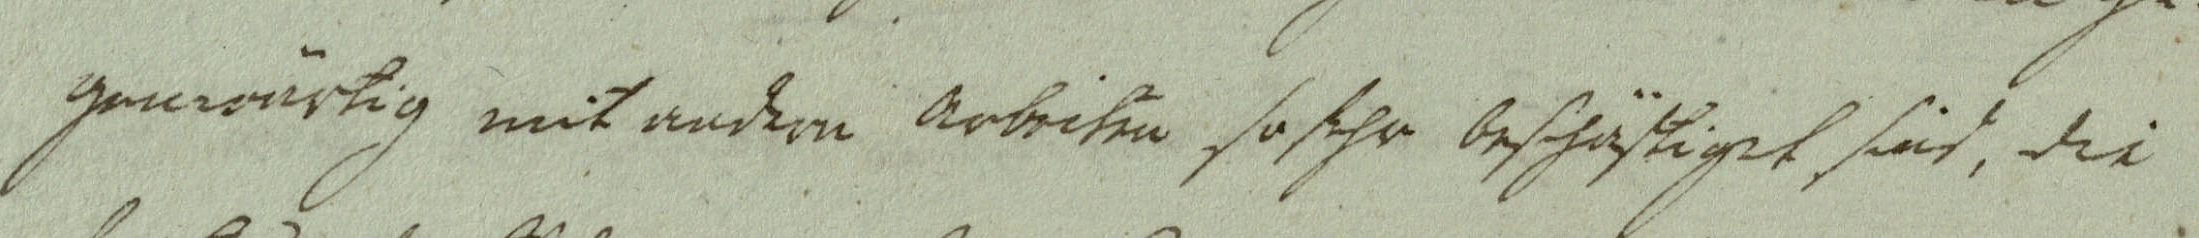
genwärtig mit andern Arbeiten so sehr beschäftiget sind, die
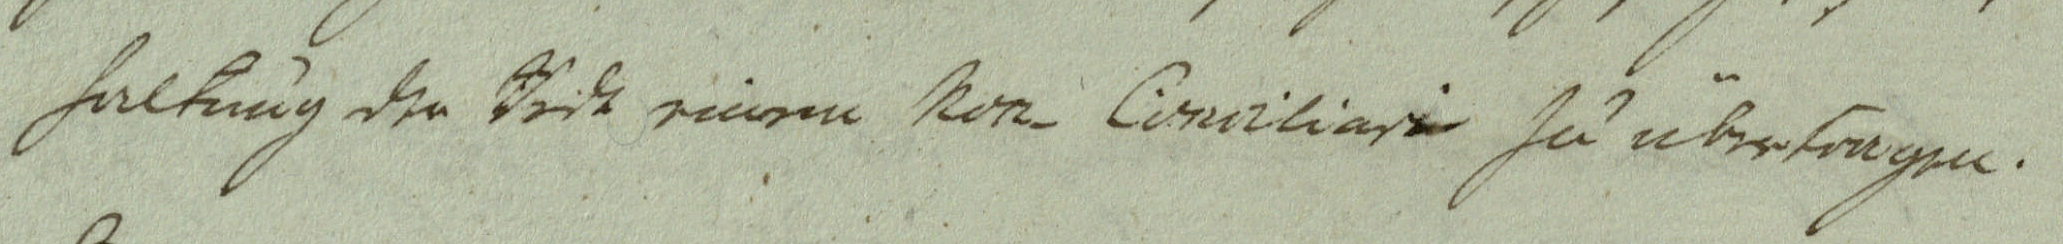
Haltung der Rede einem Non. Conciliari zu übertragen.
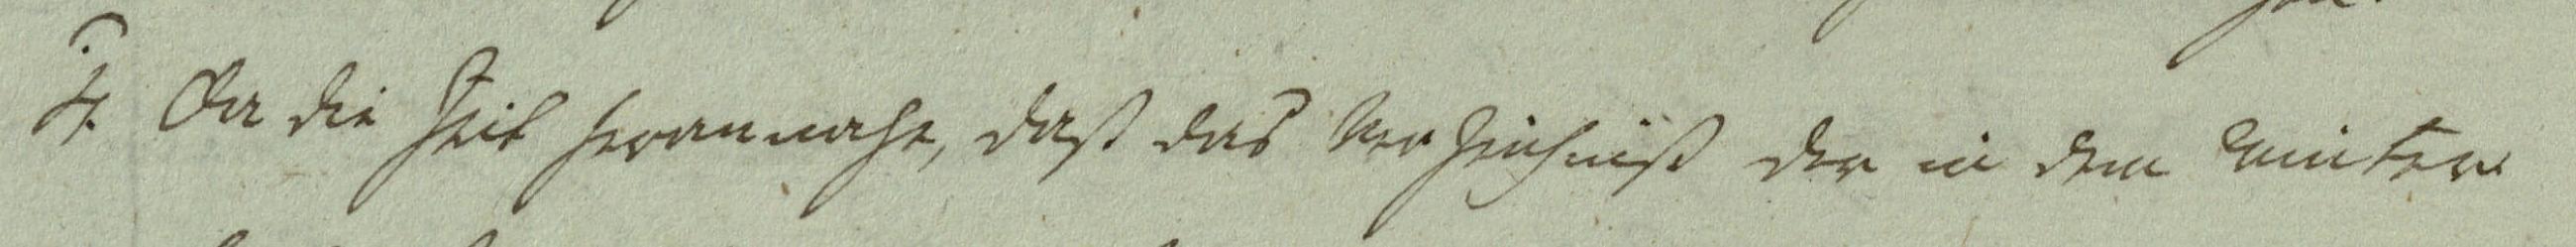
4. Da die Zeit herannahe, daß das Verzeichniß der in dem Wintern¬
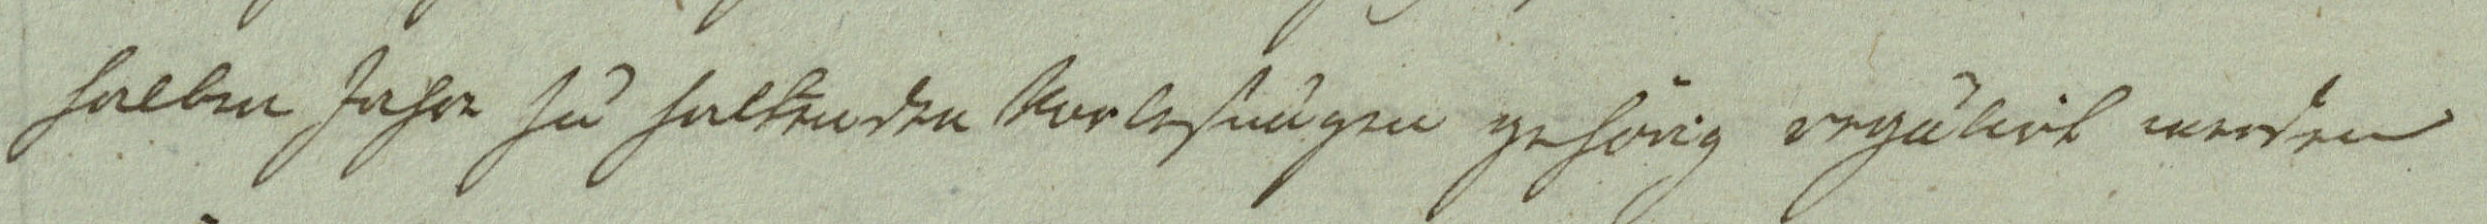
halben Jahr zu haltenden Vorlesungen gehörig regulirt werden
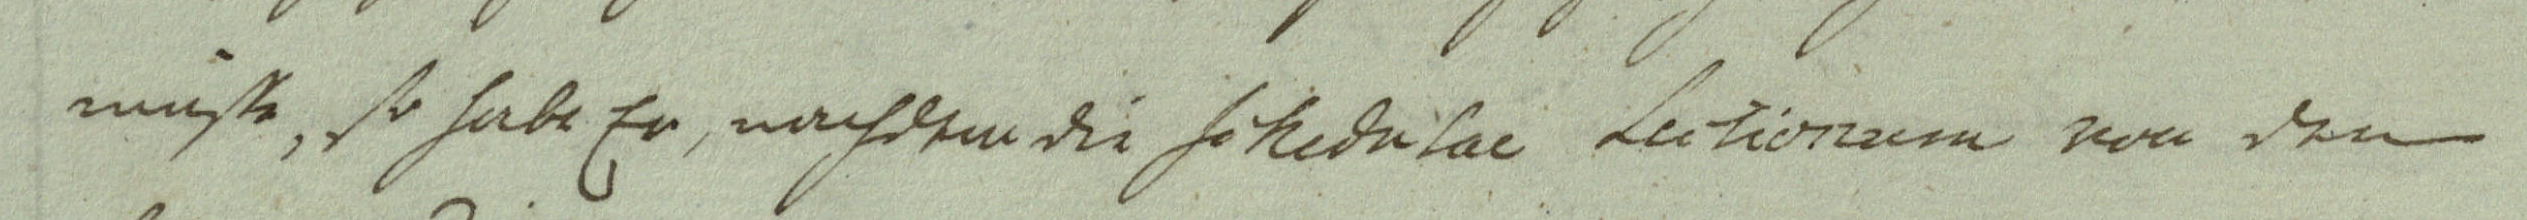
müsse, so habe Er, nachdem die Schedulae Lectionum von den
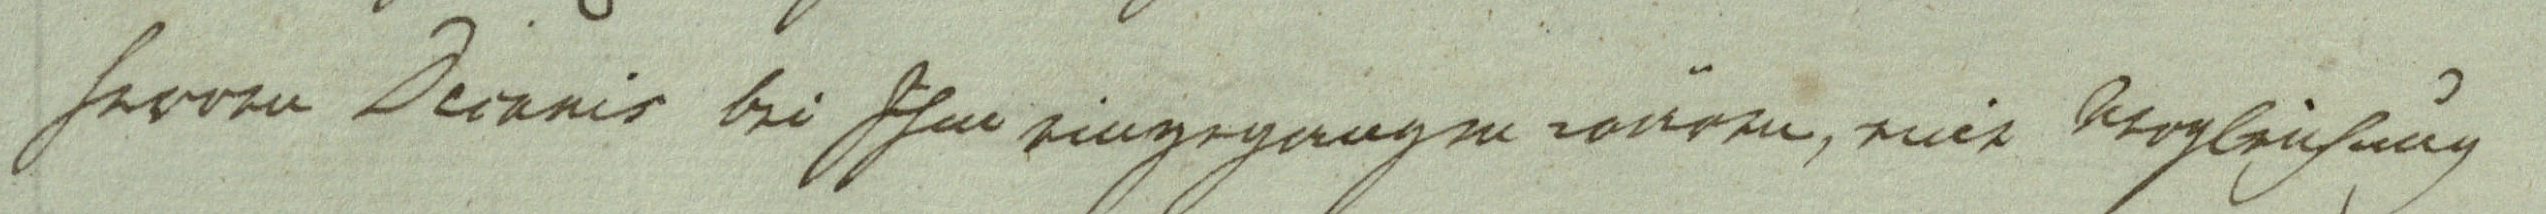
herren Decanis bei Ihm eingegangen wären, eine Vergleichung
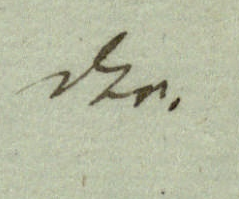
der.
